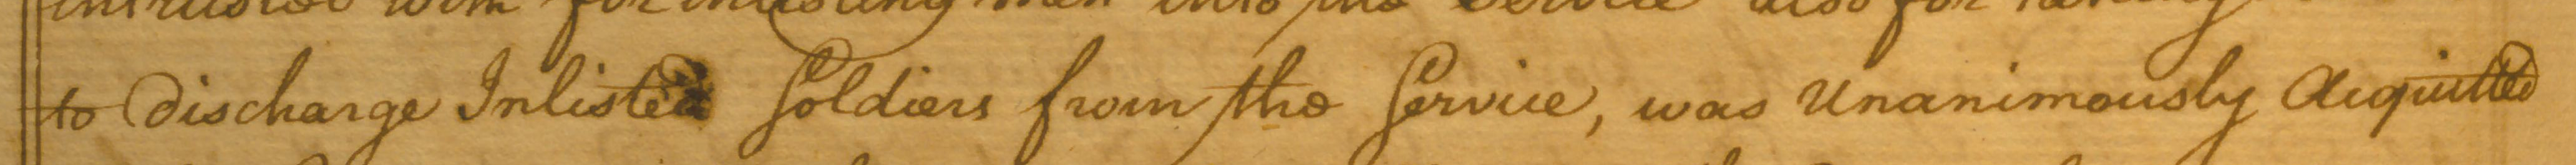to discharge Inlisted soldiers from the service, was unanimously acquitted
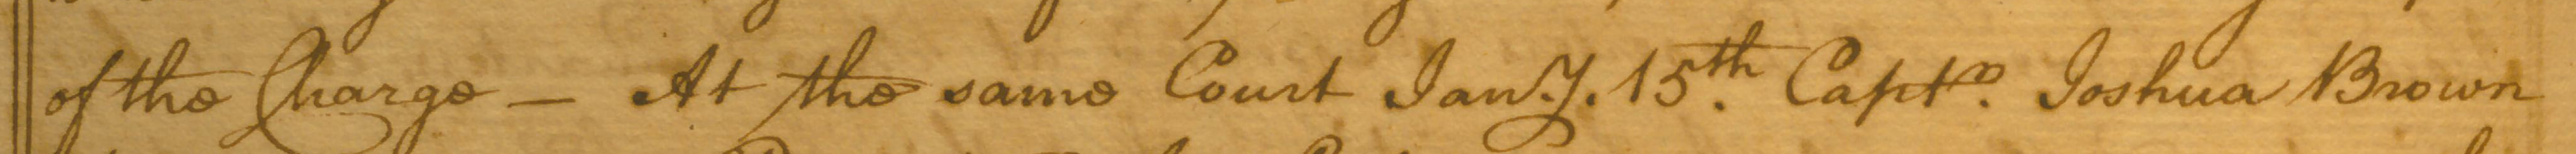of the Charge- At the same Court Jan^y. 15^th. Capt^n. Joshua Brown
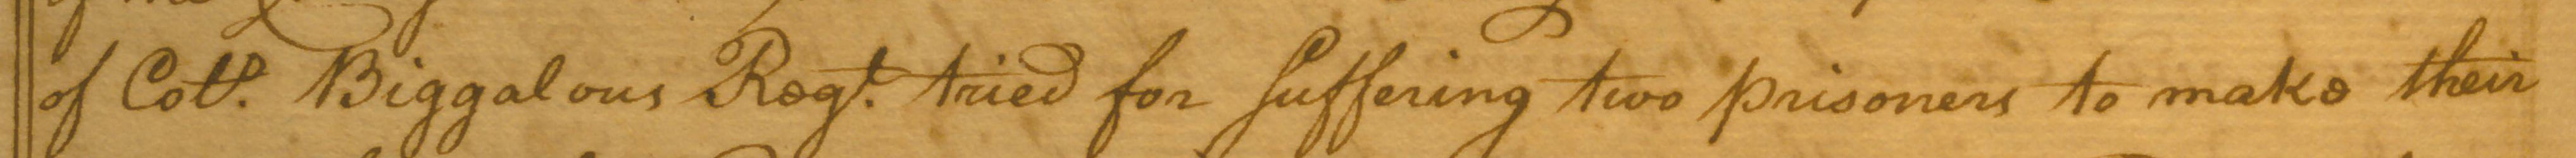of Col^o. Biggalows Reg^t. tried for suffering two prisoners to make their
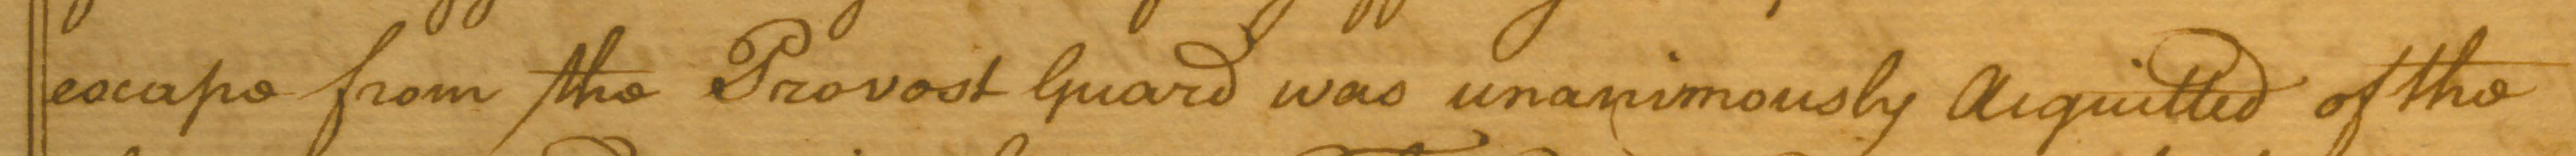escape from the Provost Guard was unanimously Acquitted of the
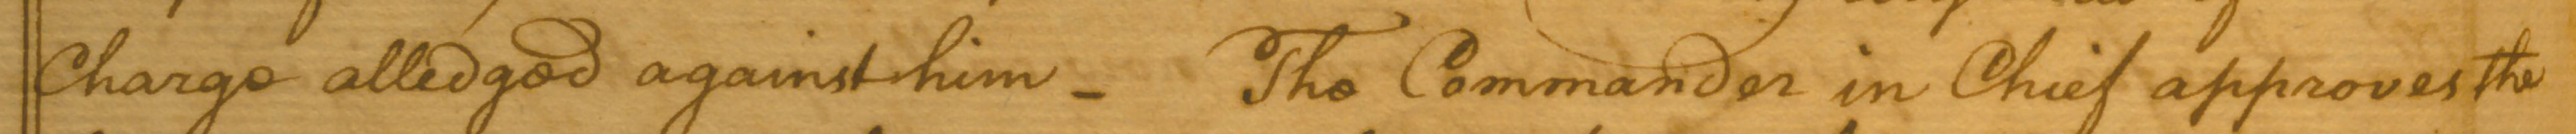Charge alledged against him- The Commander in Chief approves the
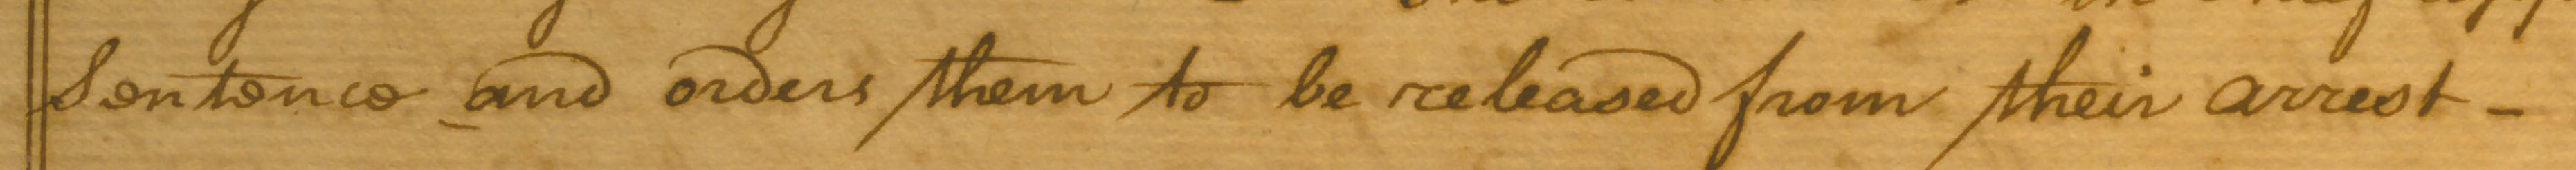Sentence and orders them to be released from their arrest-
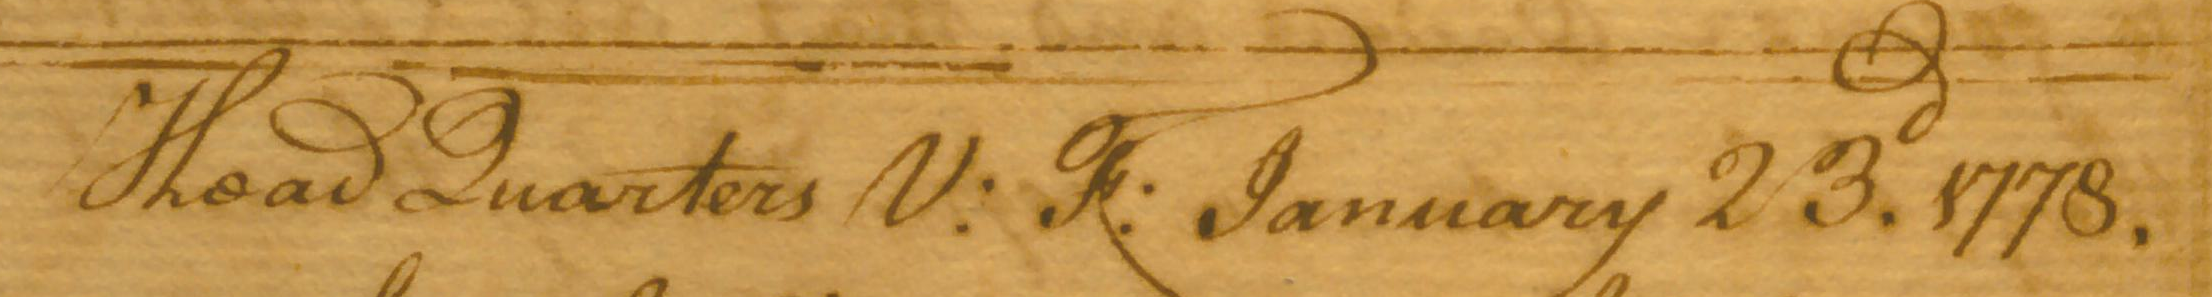Head Quarters V: F: January 23^d. 1778.
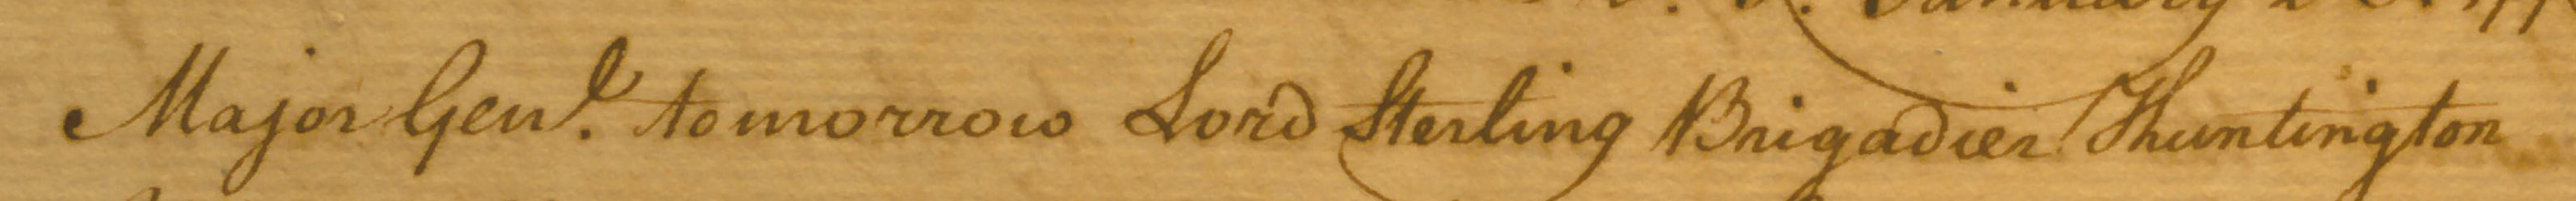Major Gen^l. tomorrow Lord Sterling Brigadier Huntington
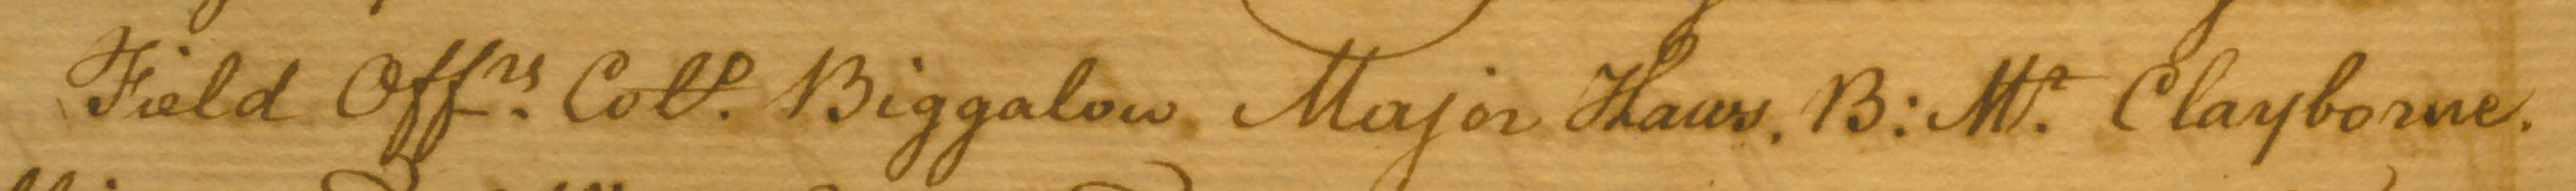Field Off^rs. Col^o. Biggalow Major Haws, B: M^r. Clayborne
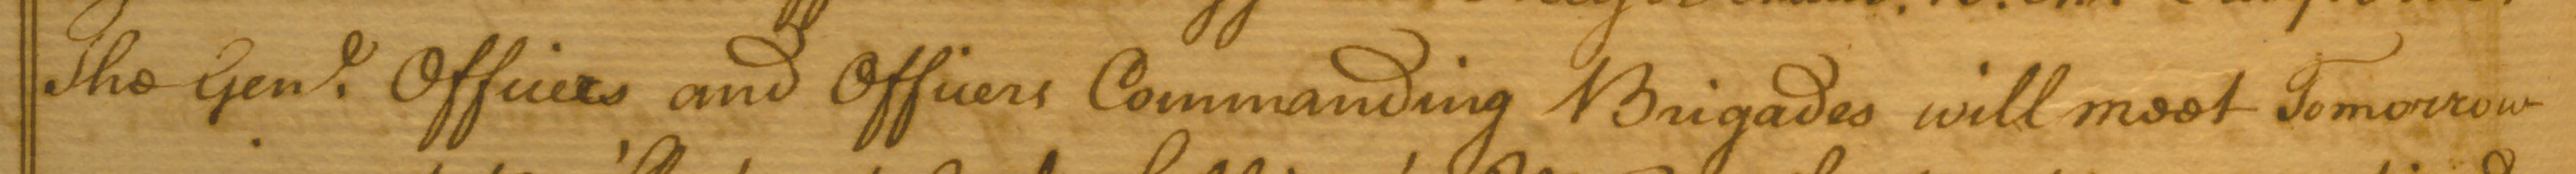The Gen^l. Officers and Officers Commanding Brigades will meet Tomorrow
